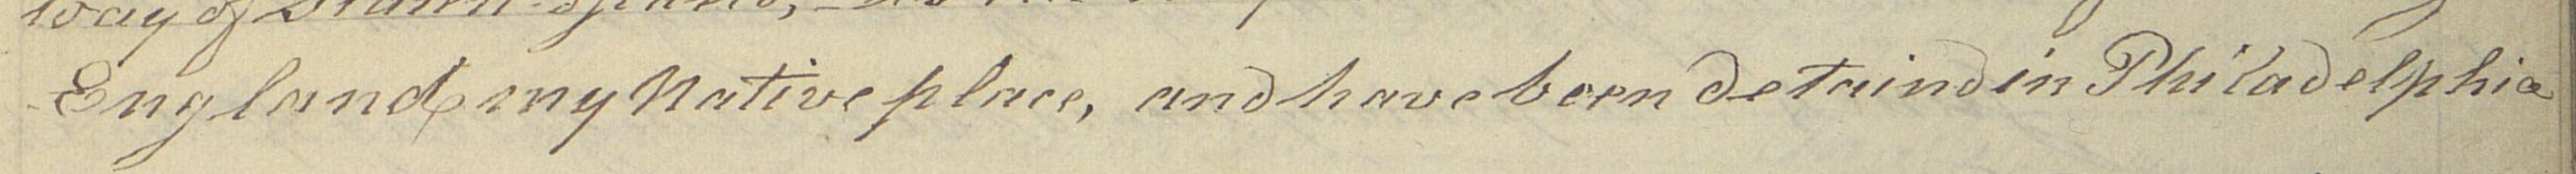England: my Native place, and have been detaind in Philadelphia
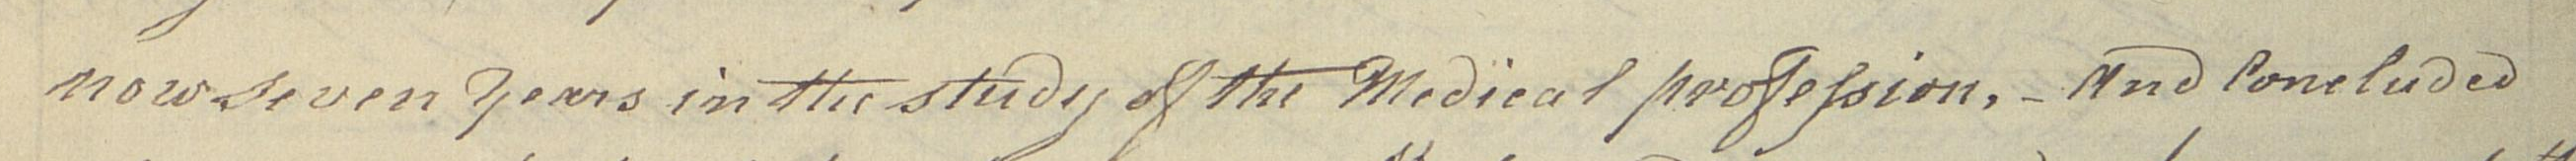now seven years in the steady of the Medical profession, and concluded
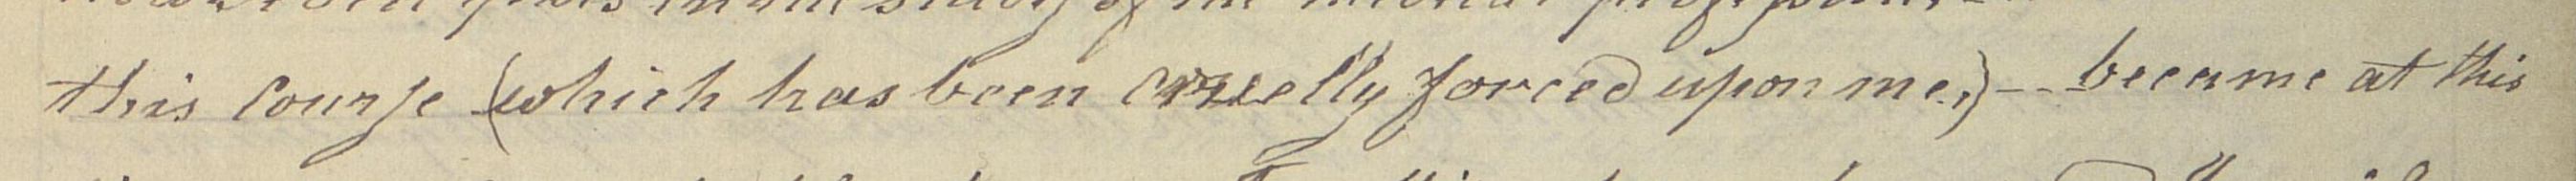this course (which has been cruelly forced upon me) became at this
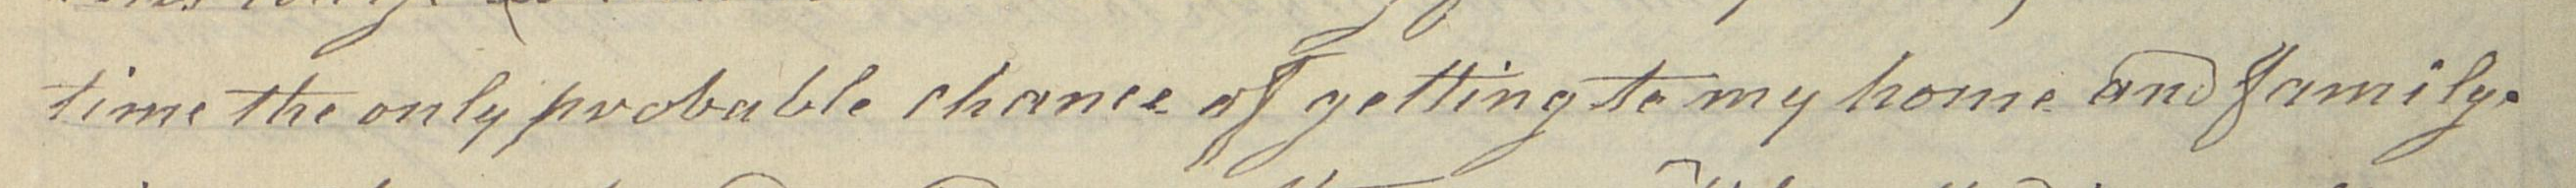time the only probably chance of getting to my home and family.
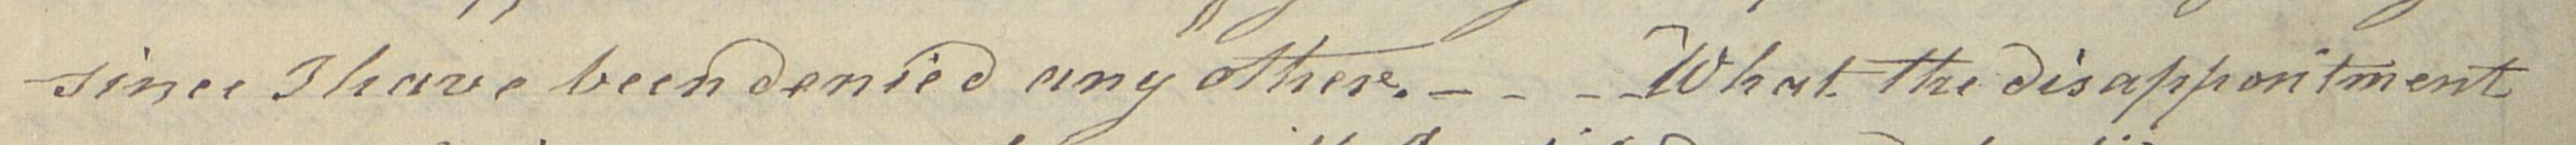since I have been densed any others. What the disappointment
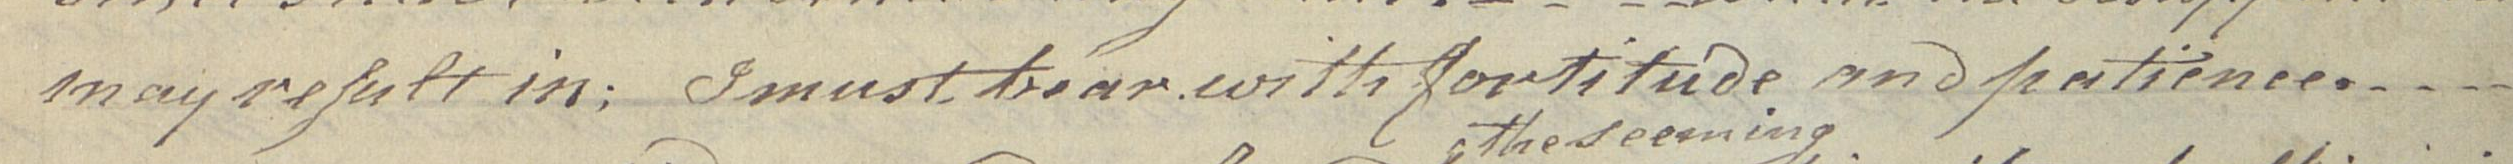may result in; I must bear with fortitude and patience.
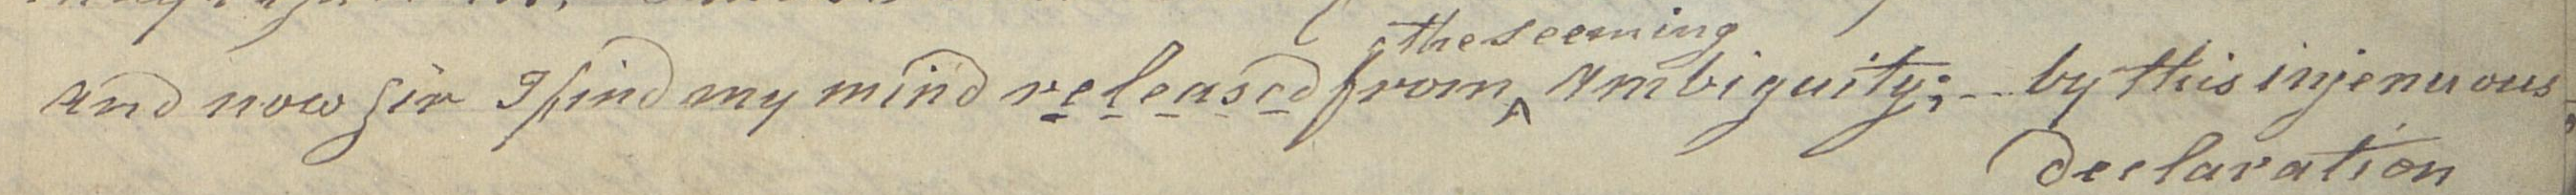And now sir I find my mind released from ^ ambiguity; by this injenuous
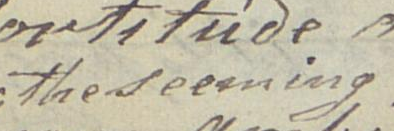the seeming
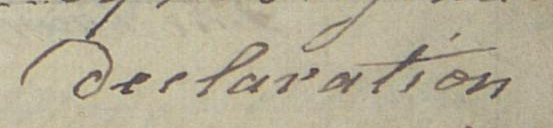declaration
